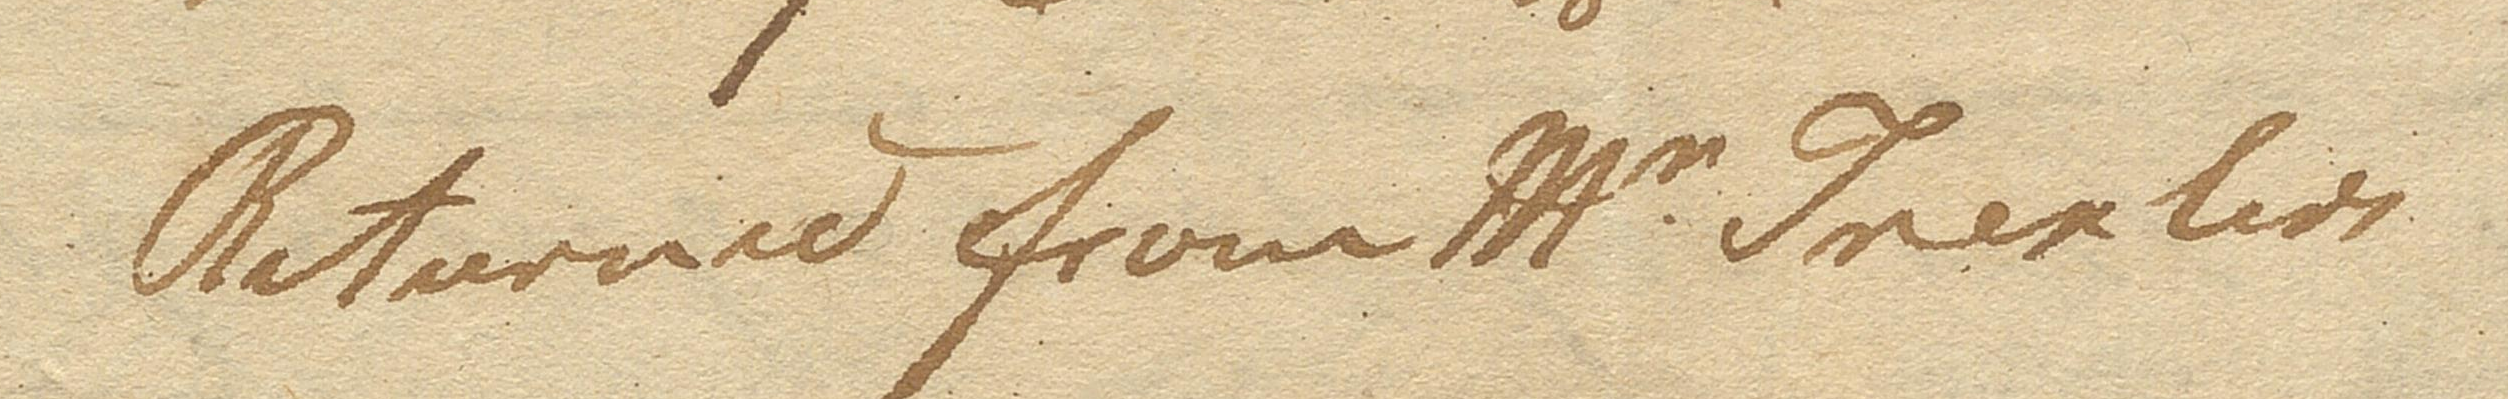Returned from M^r. Trenlers
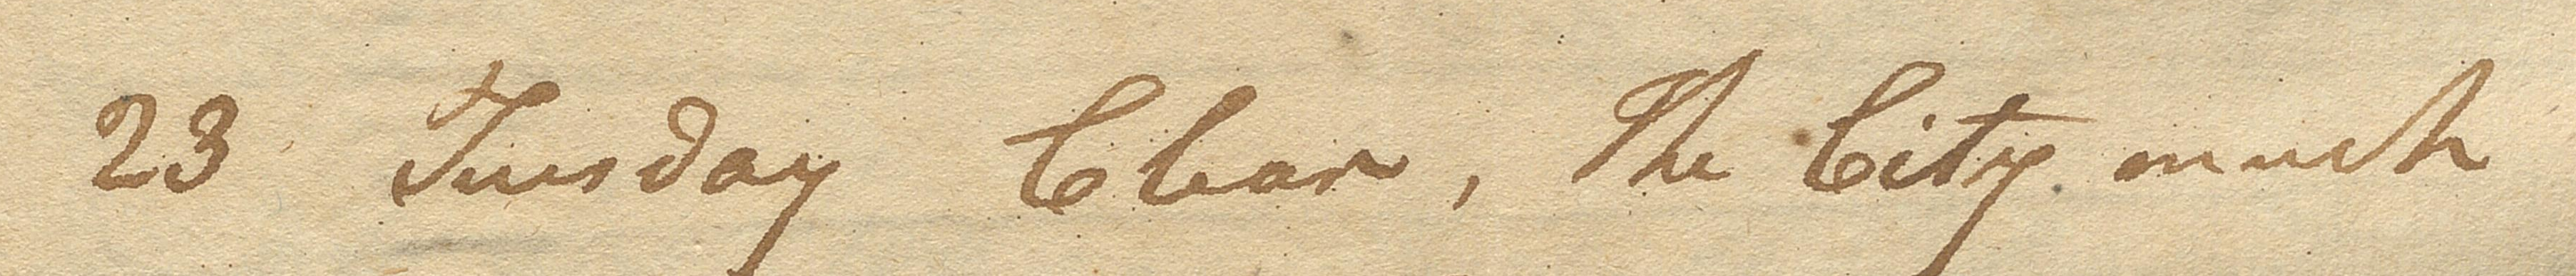23 Tuesday Clear, The City much
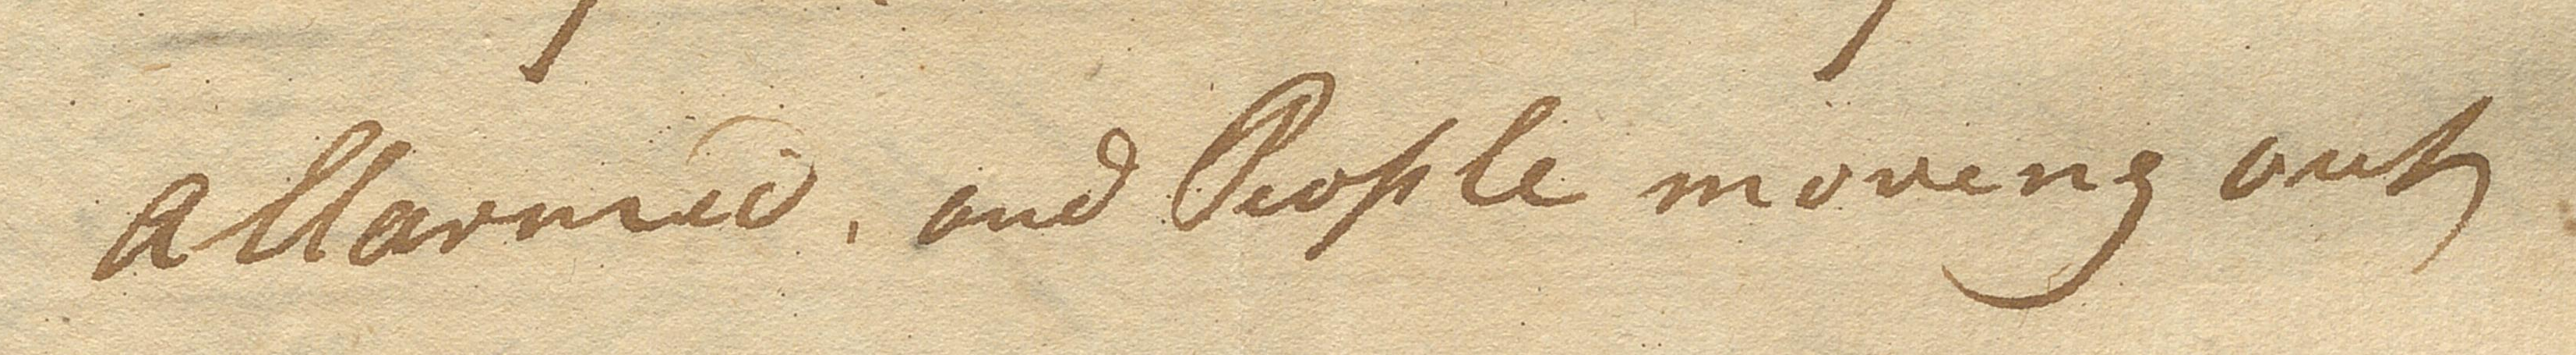Allarmed, and People moving out
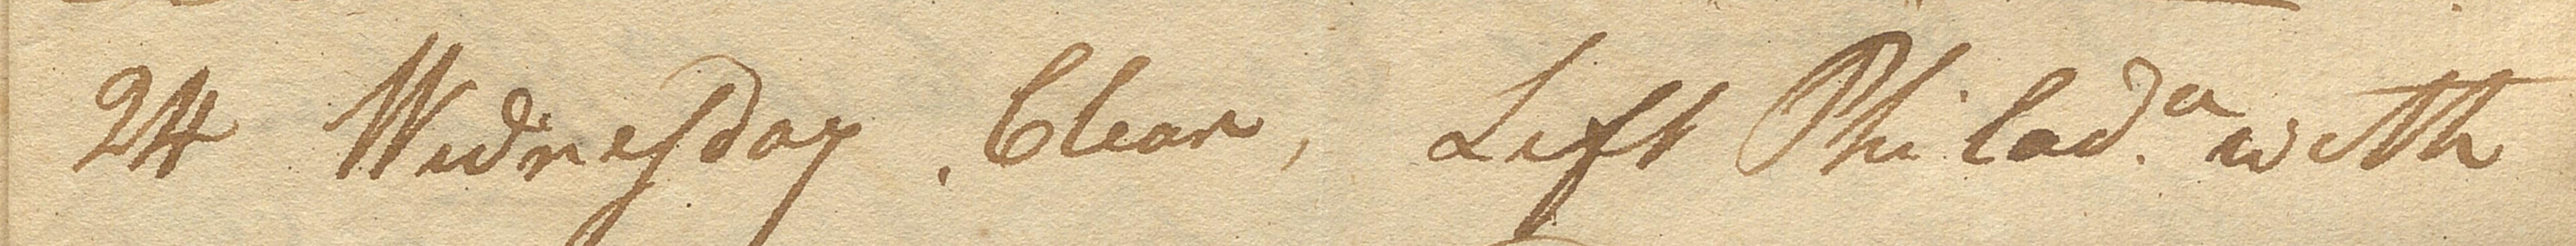24 Wednesday Clear, Left Philad^a. with
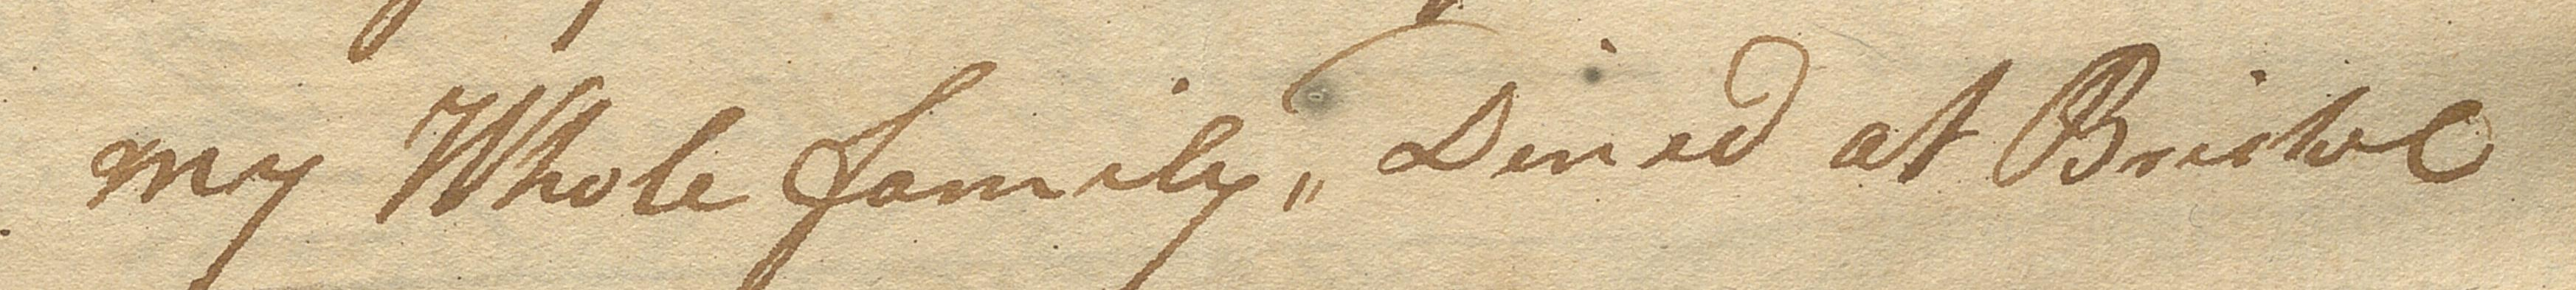my Whole family, Dined at Bristol
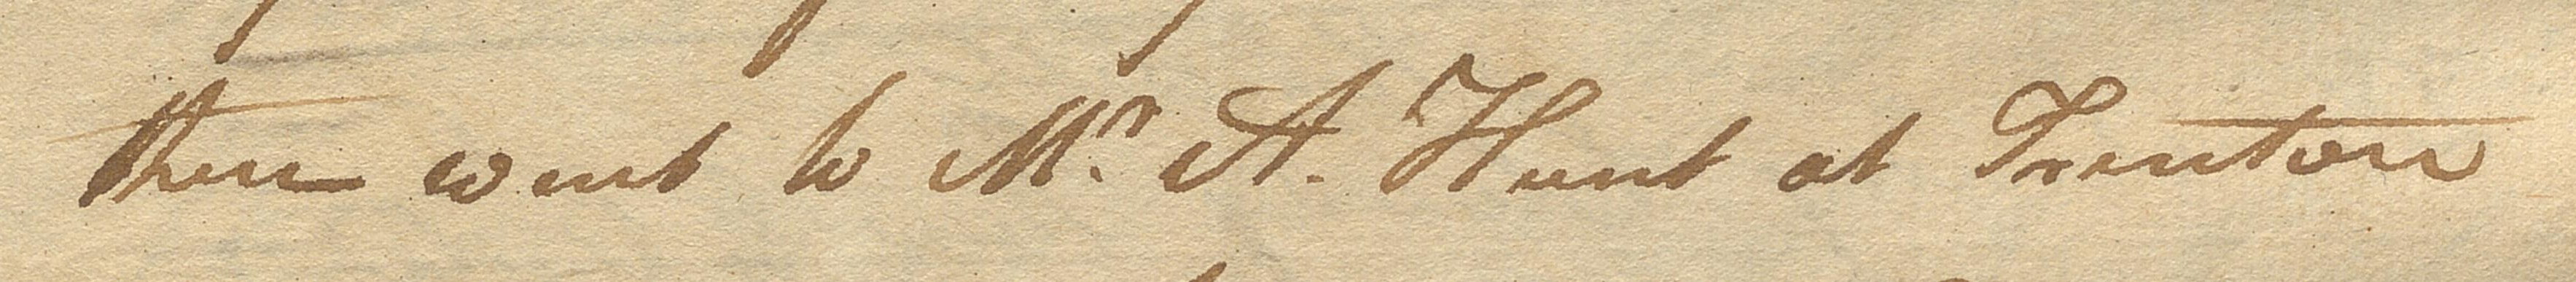then went to M^r. A. Hunt at Trenton
